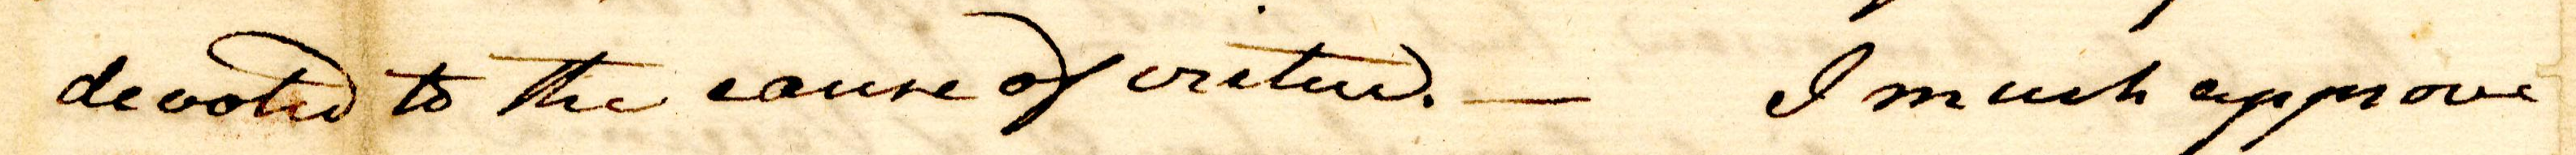devoted to the cause of virtue.- I much approve
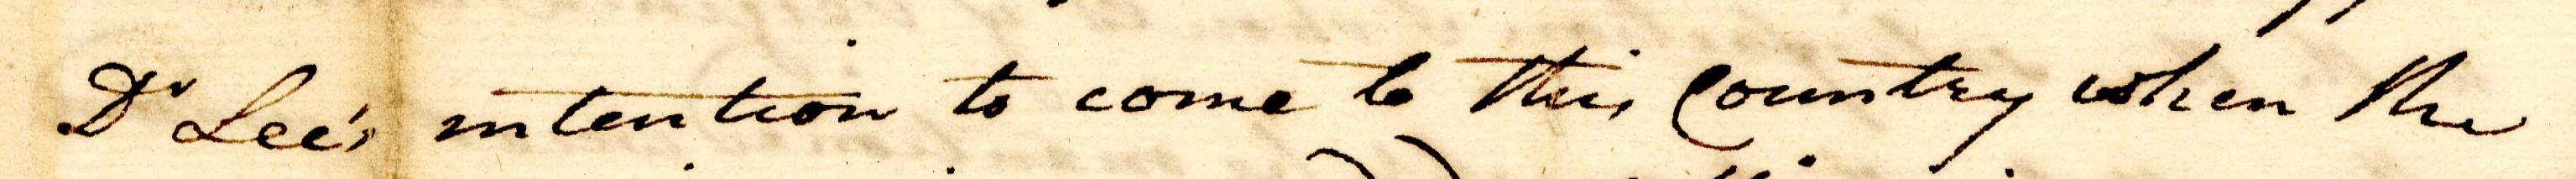D^r Lee's intention to come to this Country when the
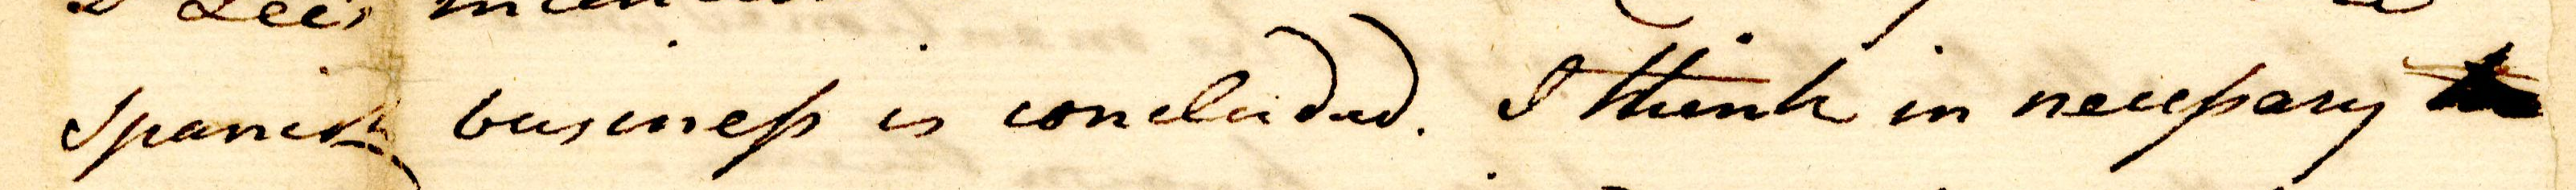Spanish business is concluded, I think in necessary [to]
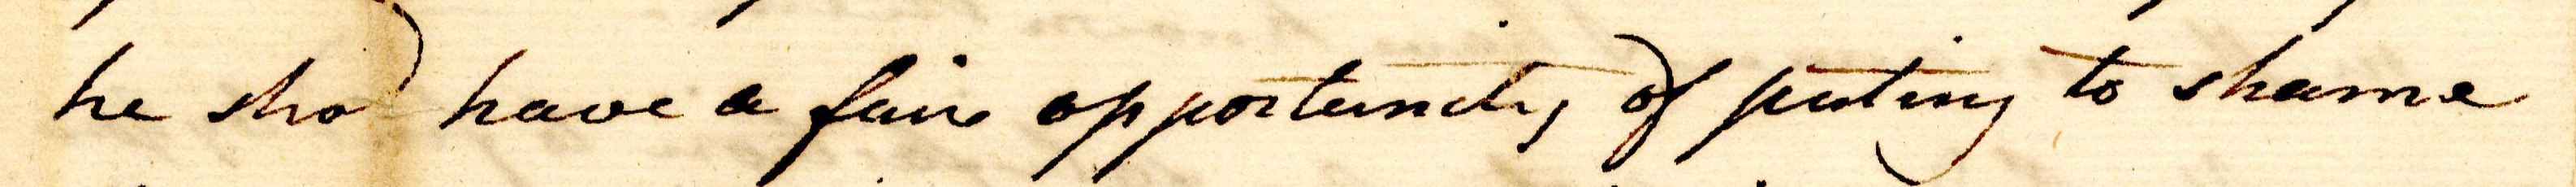he sho^d have a fair opportunity of puting to shame
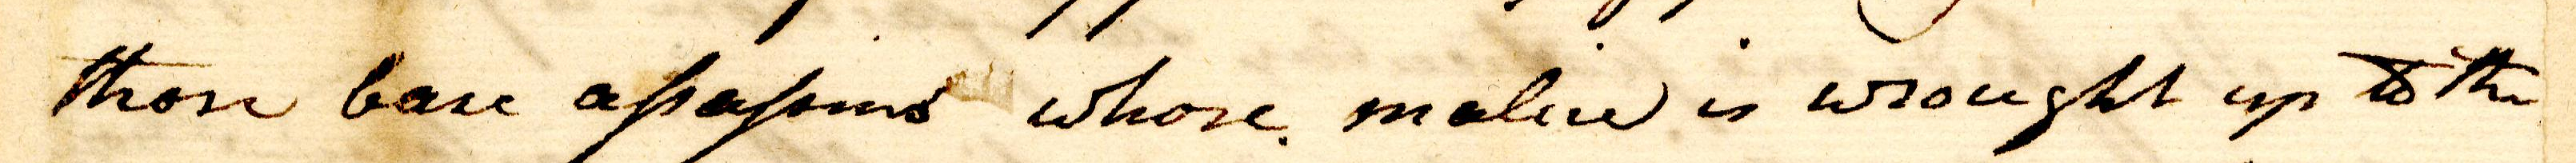those bare assassins whose malice is wrought up to the
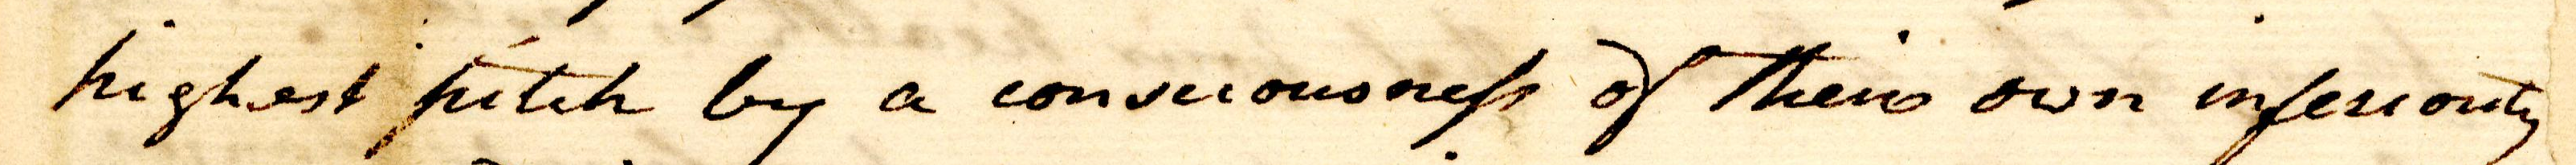highest pitch by a consciousness of their own inferiority
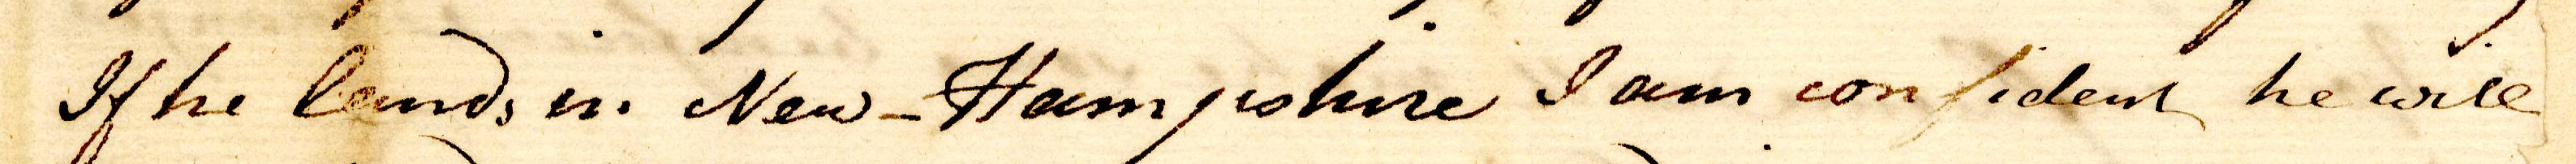If he lands in New- Hampshire I am confident he will
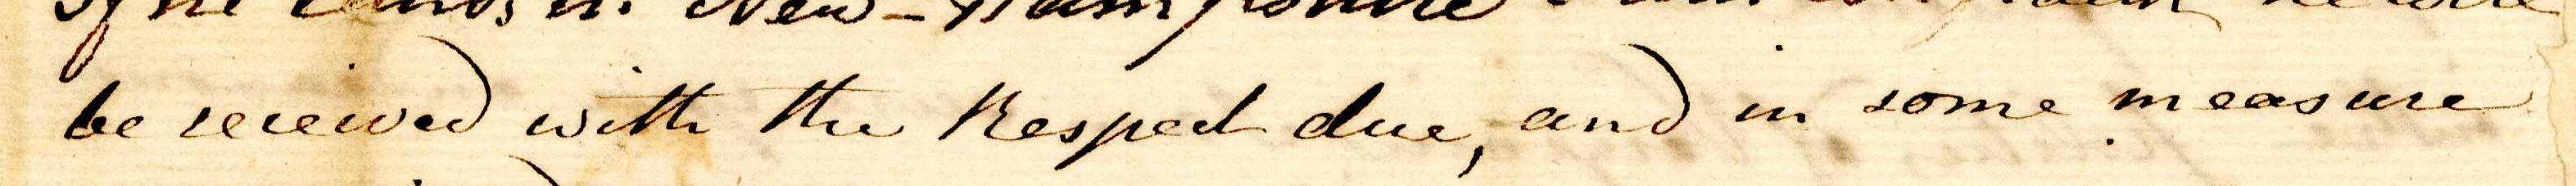be received with the Respect due, and in some measure
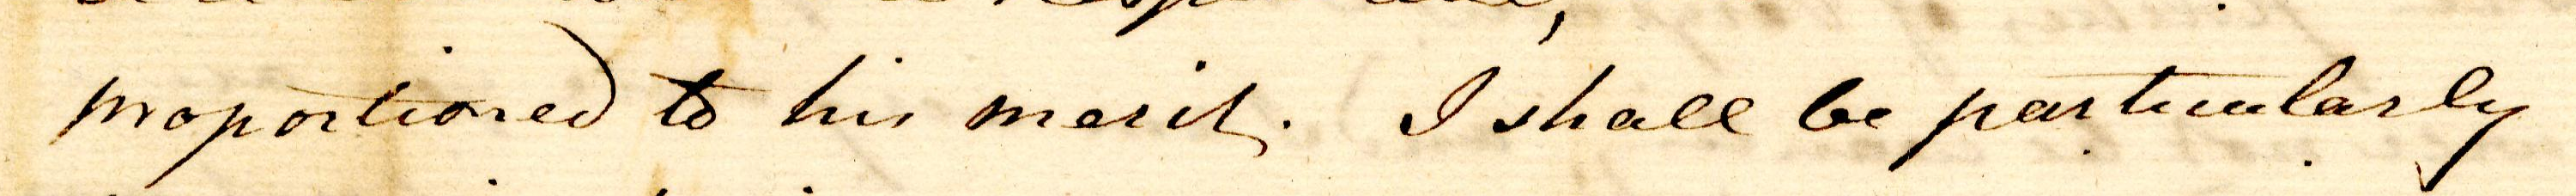proportioned to his merit. I shall be particularly
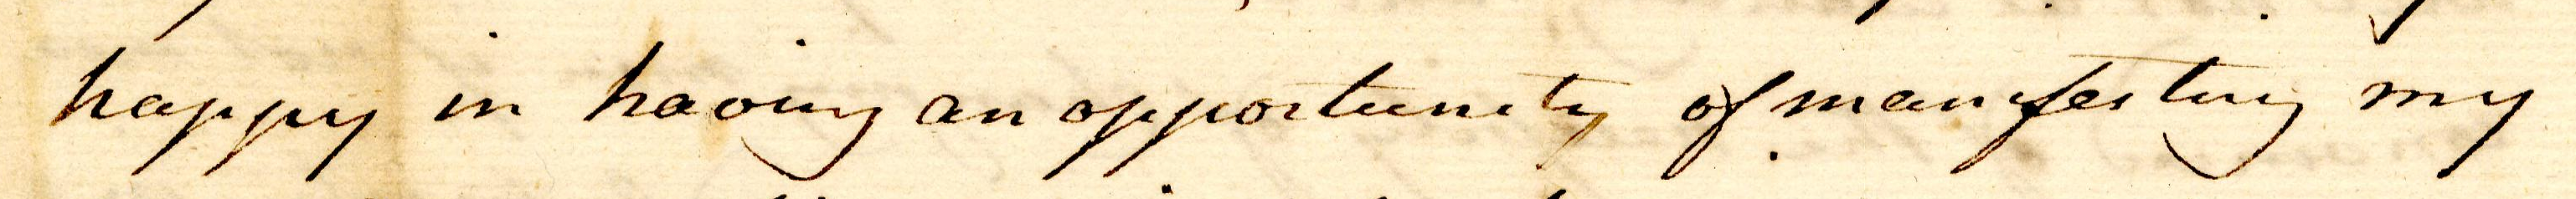happy in having an opportunity of manifesting my
